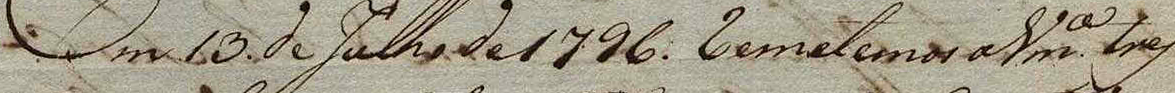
Em 13. de Julho de 1796. Remetemos a Vm.ce tres
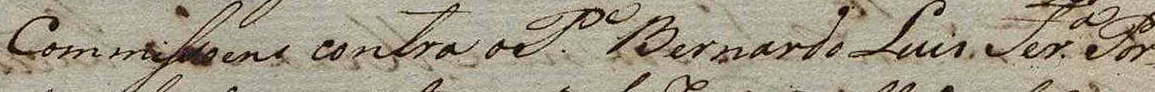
Commissoens contra o P.e Bernardo Luis Fer.a Por
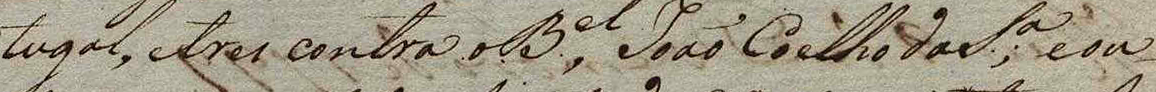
tugal, e tres contra o B.el, Ioaõ Coelho da S.a; e ou
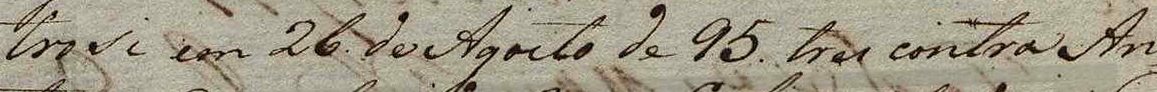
trosi em 26 de Agosto de 95. tres contra An
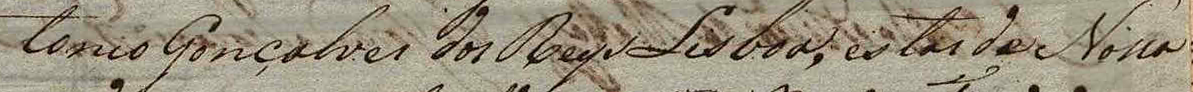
tonio Gonçalves dos Reys Lisboa, estas de Nossa
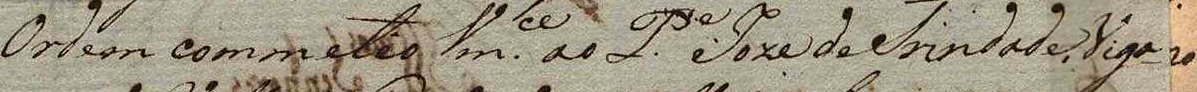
Ordem commeteo Vm.ce ao P.e Ioze de Trindade Viga
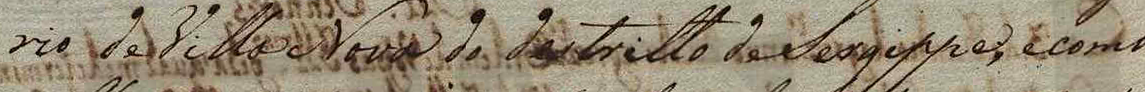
rio de Villa Nova do destritto de Sergippe, e como
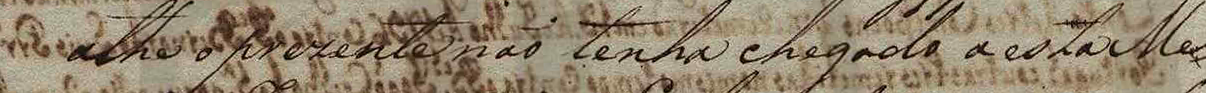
athe o prezente naõ tenha chegado a esta Me
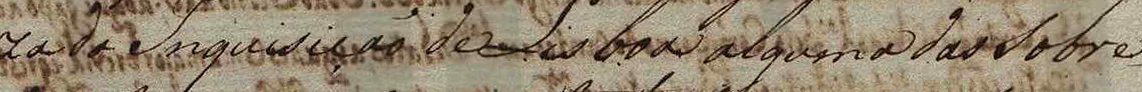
za da Inquisiçaõ de Lisboa alguma das Sobre
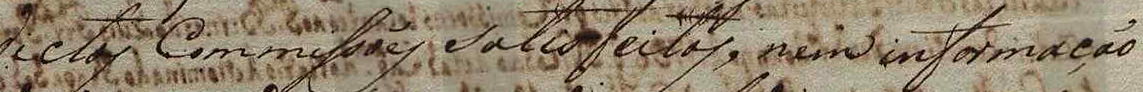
dictas Commissoẽs satisfeitas, nem informaçaõ
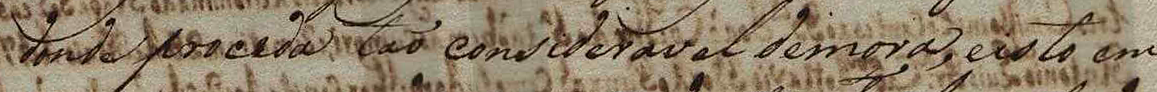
donde proceda taõ consideravel demora, e isto em
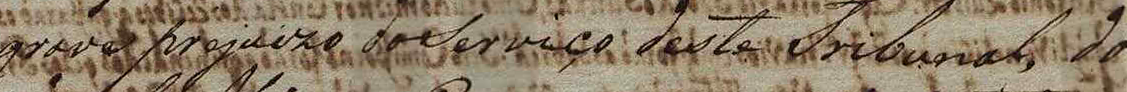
grave prejuizo do Serviço deste Tribunal, do
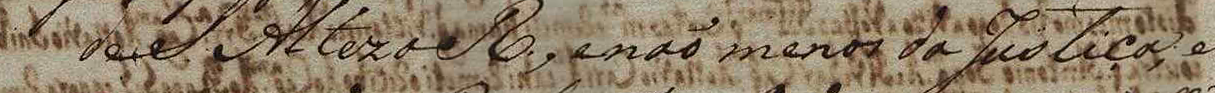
de S. Alteza R., e naõ menos da Justiça, e
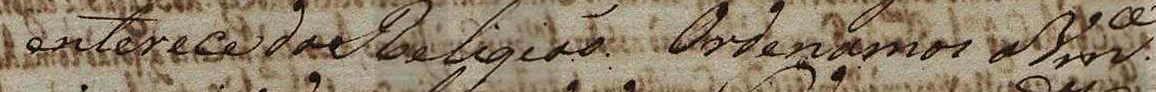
enterece da Religiaõ. Ordenamos a Vm.ce
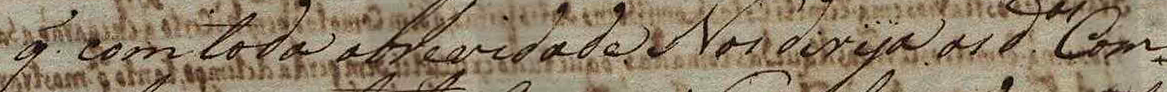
q̄ com toda a brevidade Nos dirija as d.as Com
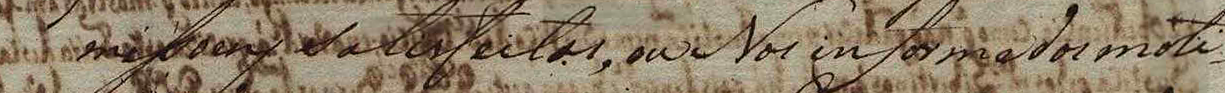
missoens Satisfeitas, ou Nos informe dos moti
